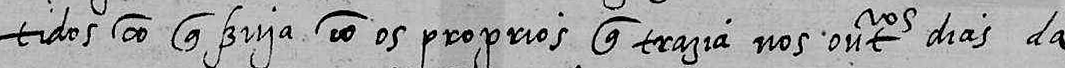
tidos c̄o q̄ ꞩuja c̄o os proprios q̄ trazia nos outros dias da
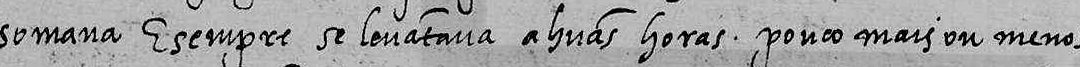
somana E sempre se leuātaua a huās horas . pouco mais ou menos
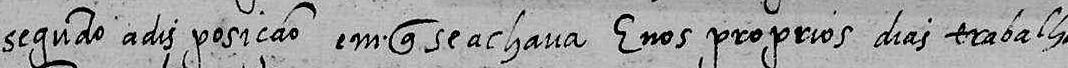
segūdo a disposiçaõ em q̄ se achaua E nos proprios dias trabalha
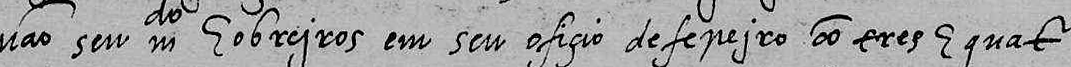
uão seu mdo E obrejros em seu oficio de ferrejro c̄o tres E quatro
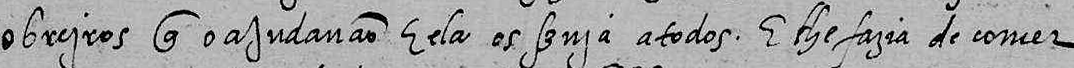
obrejros q̄ o aJudauão E ela os ꞩuja a todos. E lhe fazia de comer
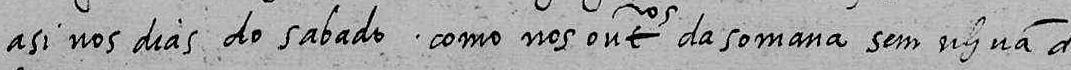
asi nos dias do sabado como nos outros da somana sem nhuā di
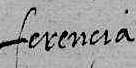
ferencia
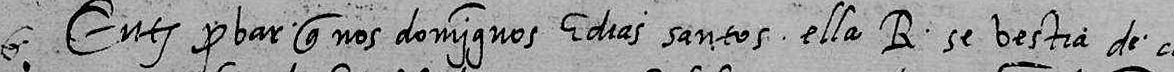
6 Entꝭ ꝓvar q̄ nos domj̄guos E dias santos ella R. se vestia de ca
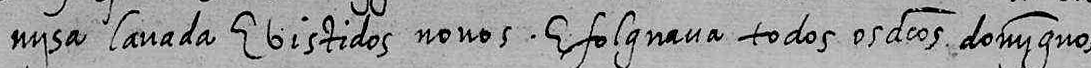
mjsa lauada E vistidos nouos . E folguaua todos os dc̄os domj̄guos
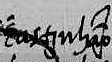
E as tjnhão
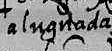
aluguadas
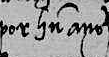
por hū ano
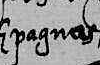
E paguas
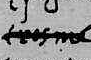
tres me
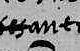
ses ante
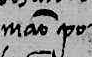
maõ por
